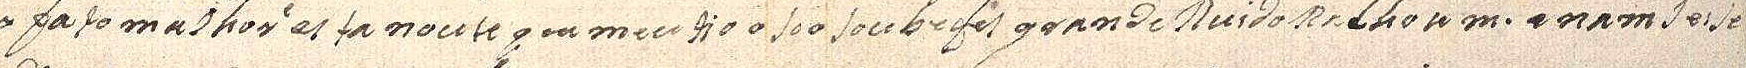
o fato maihor esta noute que meu tio o o soube fes grande Ruido RaLhou m.to a nam sei se
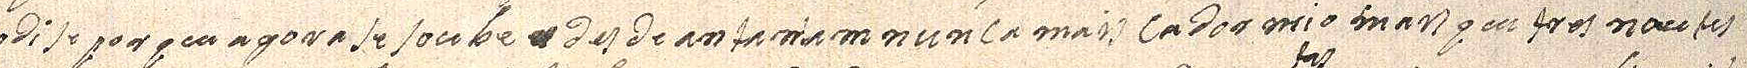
o dise porque agora se soube _ desde antam am nunca mais ca dormio mais que tres noutes que
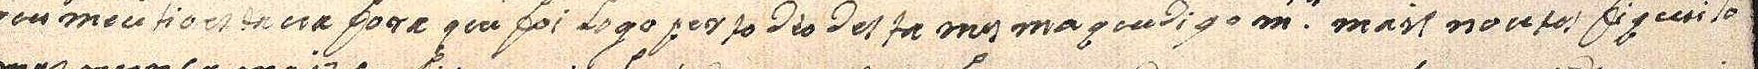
meu tio estaua fora que foi logo perto o desta mesma que digo m.tas mais noutes fiquei so
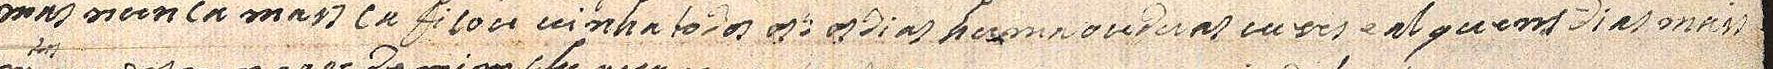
mas nunca mais ca ficou uinha todos os os dias huma ou duas uezes e alguens dias mais
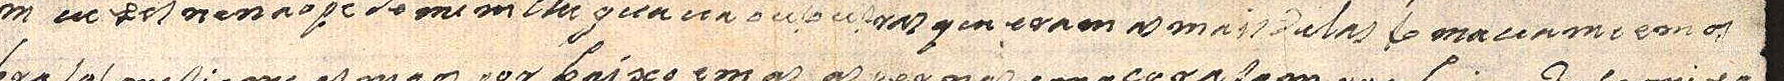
mtas uezes nen ao pe de mim cheguaua ou outras que eram as mais delas tomaceame em os
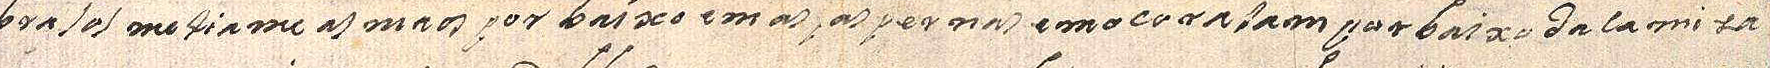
brasos metiame as maos por baixo em as as pernas em o corasam por baixo da camiza
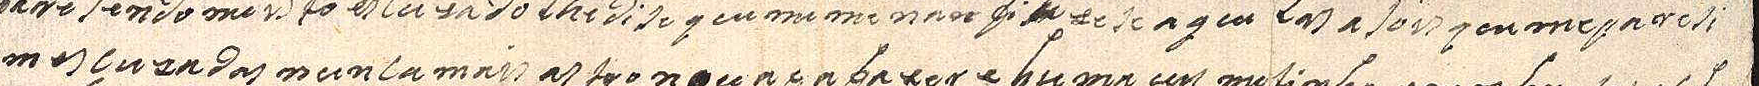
e paresendome isto escuzado lhe dise que m me nan fitaze se aquelas asois qeu me paresi
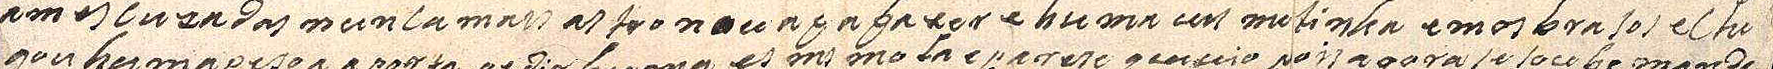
am escuzadas nunca mais as tronace a a fazer e huma ues metinha em os brasos e che
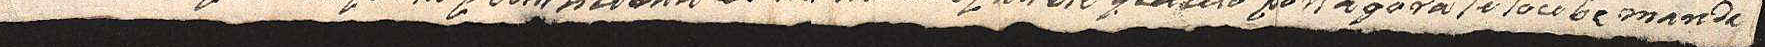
gou huma pesoa a porta pedir huma esm mola e parese que uio pois agora se soube manda
